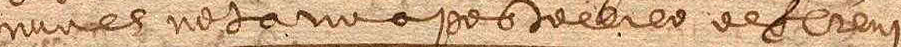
nunes notario apostollico o escreuj
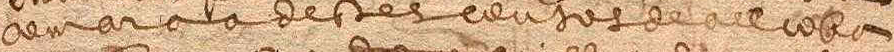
comarca destes coutos de allcoba
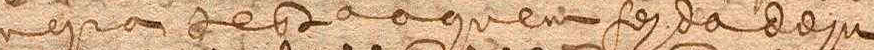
nejra testa a quem foj dado ju
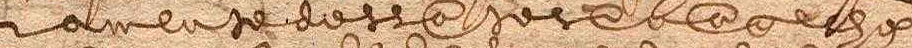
ramento dos sātos euāgelhos
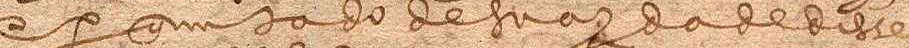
e ꝑguntado de sua jdade disse
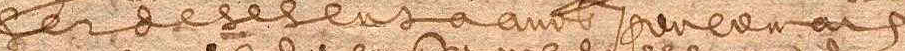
ser de sesenta anos̄ pouco mais
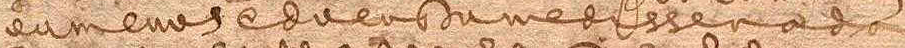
ou menos e do costume disse nada
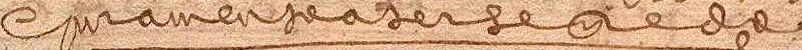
e juramento a ter segredo
